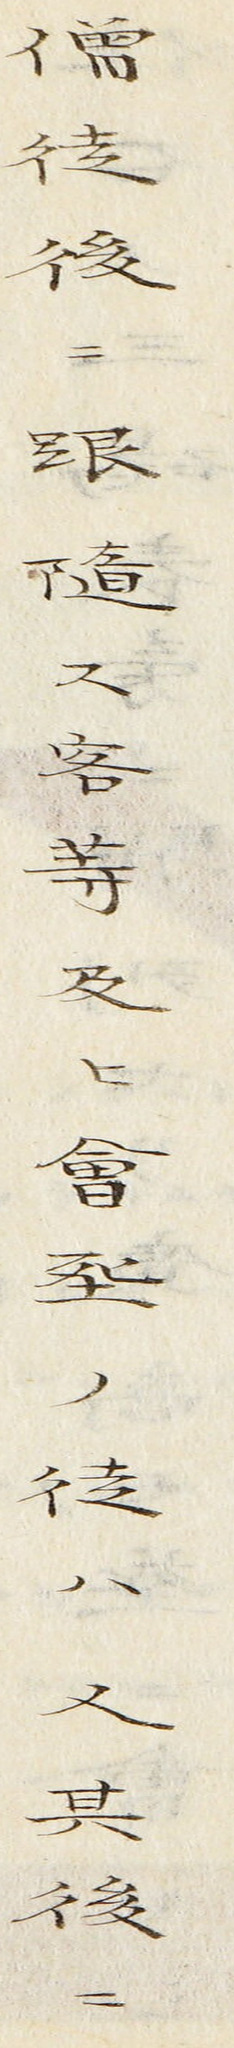僧徒後ニ跟随ス客等及ヒ会㘸ノ徒ハ又其後ニ
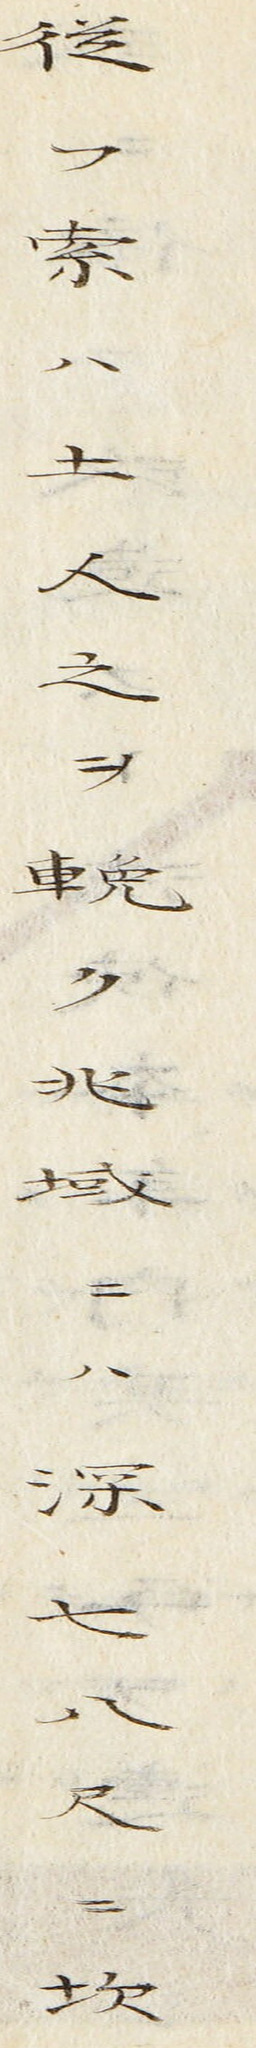従フ索ハ土人之ヲ輓ク兆域ニハ深七八尺ニ坎
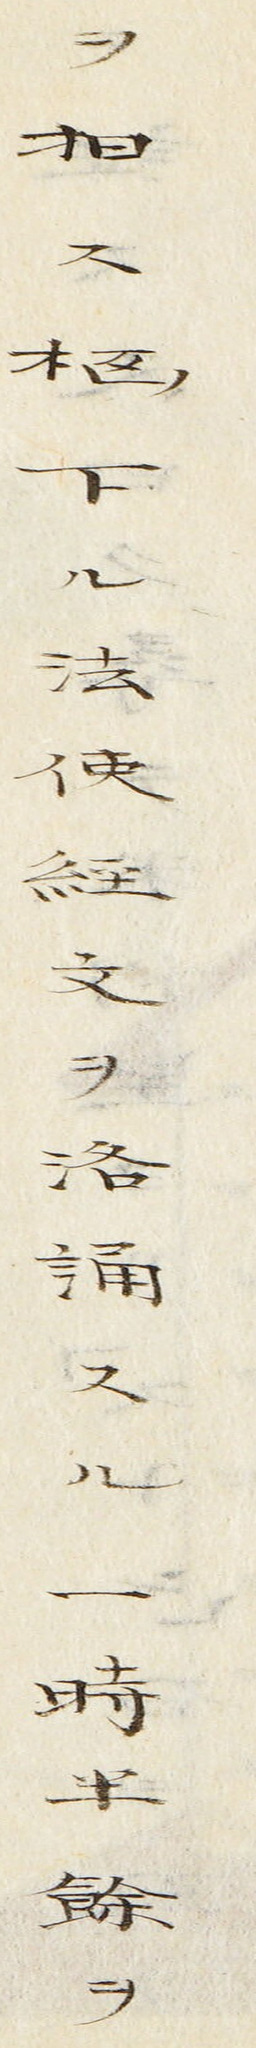ヲ抇ス柩下ル法使経文ヲ洛誦スル一時半余ヲ
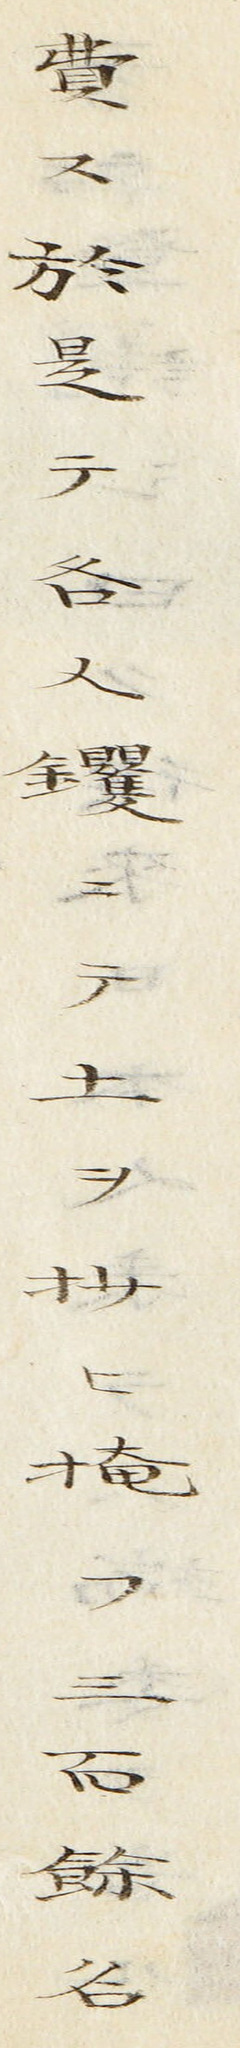費ス於是テ各人钁ニテ土ヲ抄ヒ掩フ三百余名
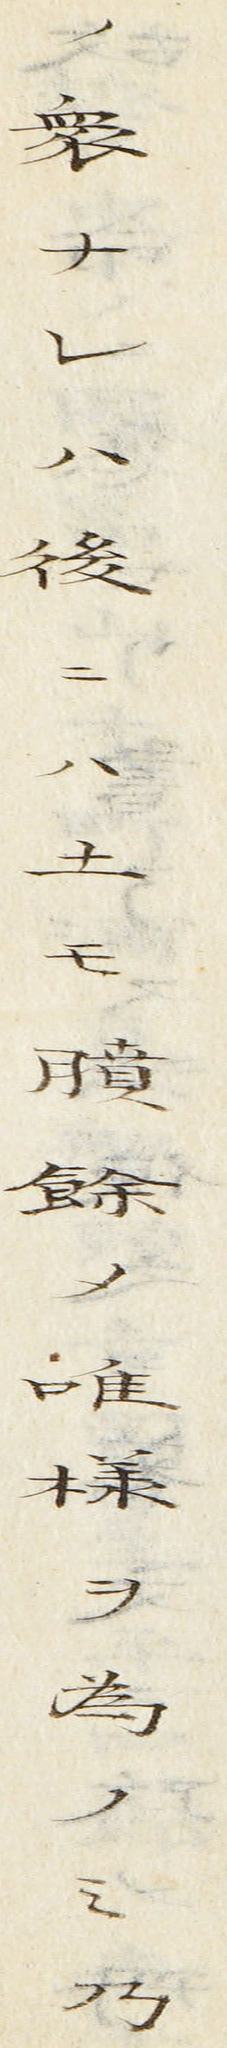ノ衆ナレハ後ニハ土モ膹余シテ唯様ヲ為ノミ乃
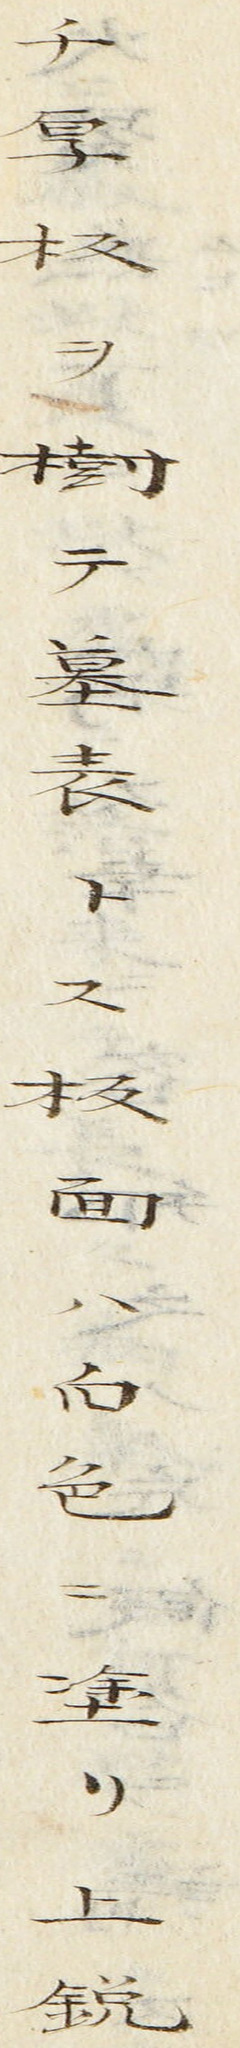チ厚板ヲ樹テ墓表トス板面ハ白色ニ塗リ上鋭
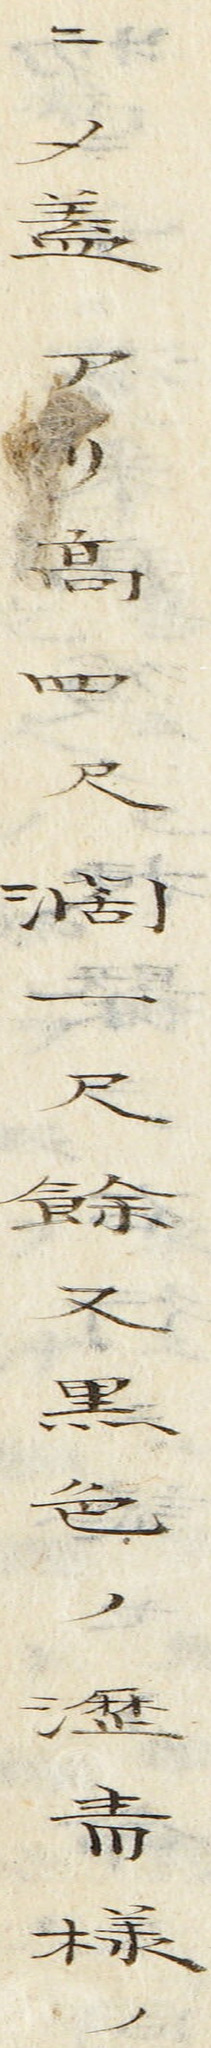ニシテ蓋アリ高四尺濶一尺余又黒色ノ瀝青様ノ

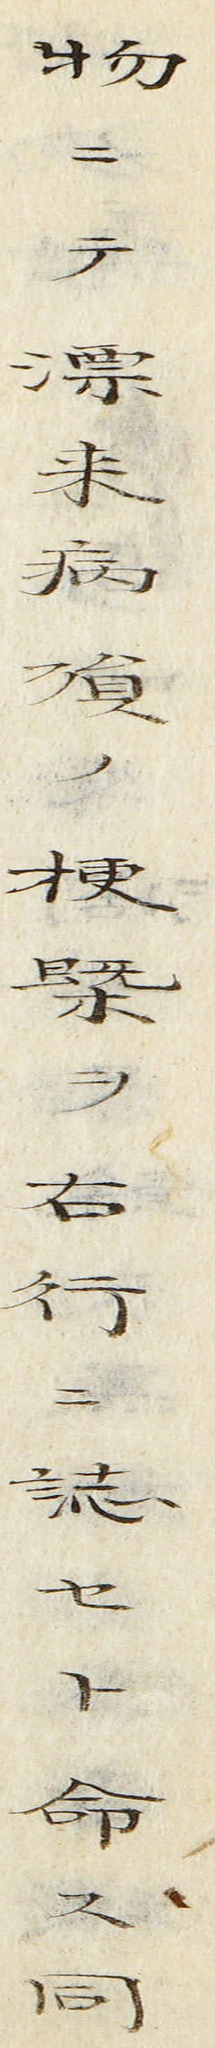物ニテ漂来病殞ノ梗概ヲ右行ニ誌セト命ス同
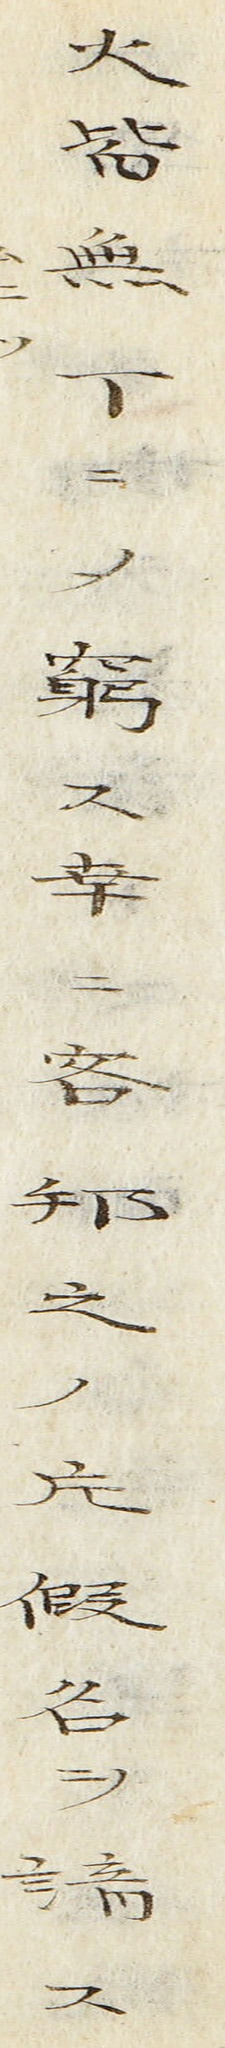火皆無丁ニシテ窮ス幸ニ客邦之ノ片仮名ヲ請ス
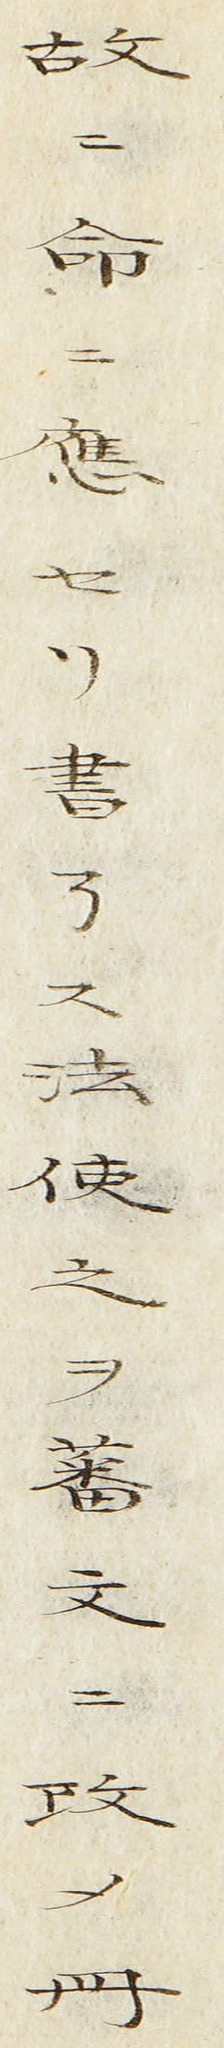故ニ命ニ応セリ書了ス法使之ヲ蕃文ニ改メ冊
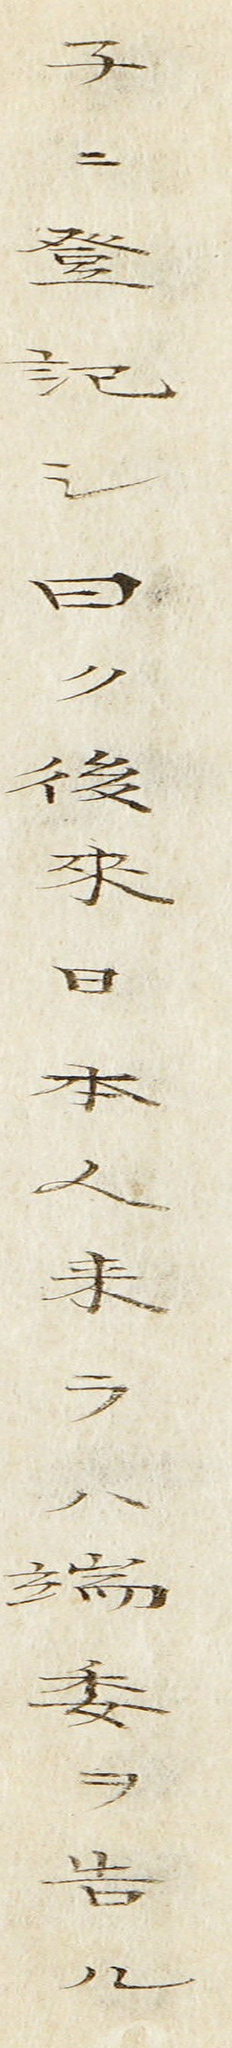子ニ登記シ曰ク後来日本人来ラハ端委ヲ告ル
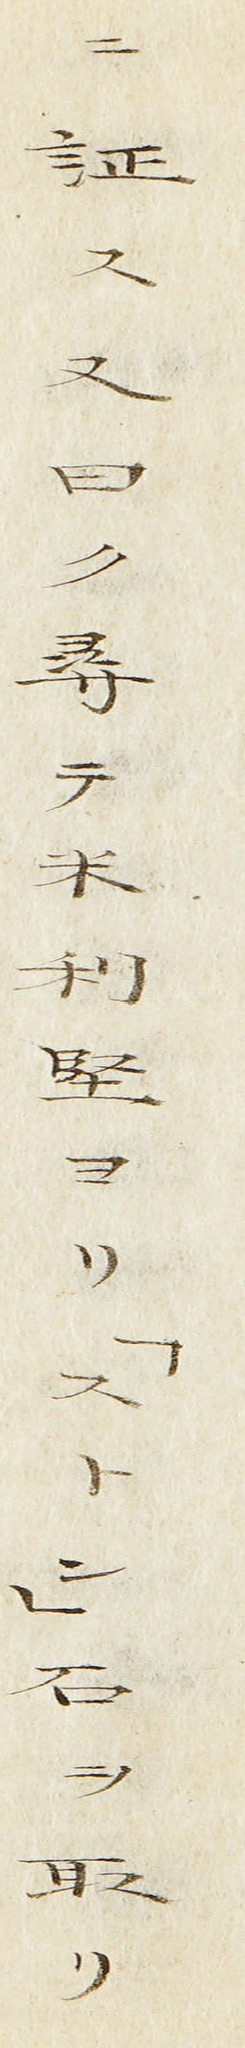ニ証ス又曰ク尋テ米利堅ヨリ「ストン」石ヲ取リ
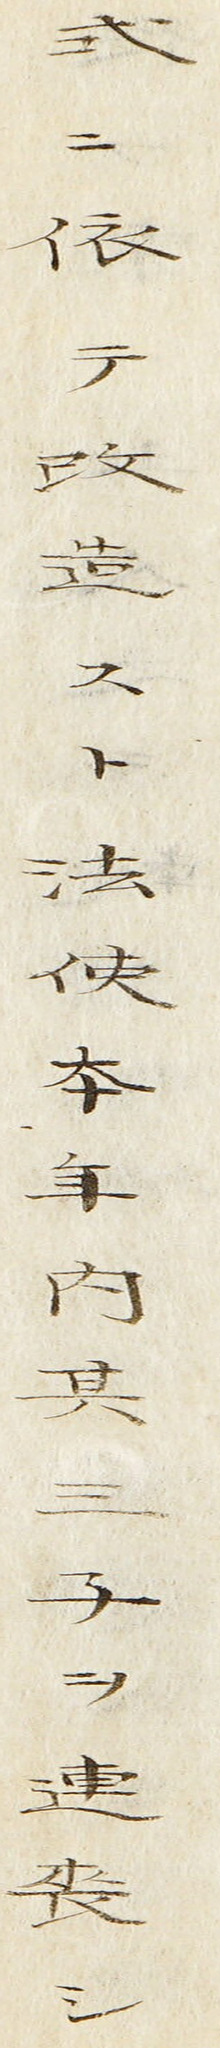式ニ依テ改造スト法使本年内其三子ヲ連喪シ
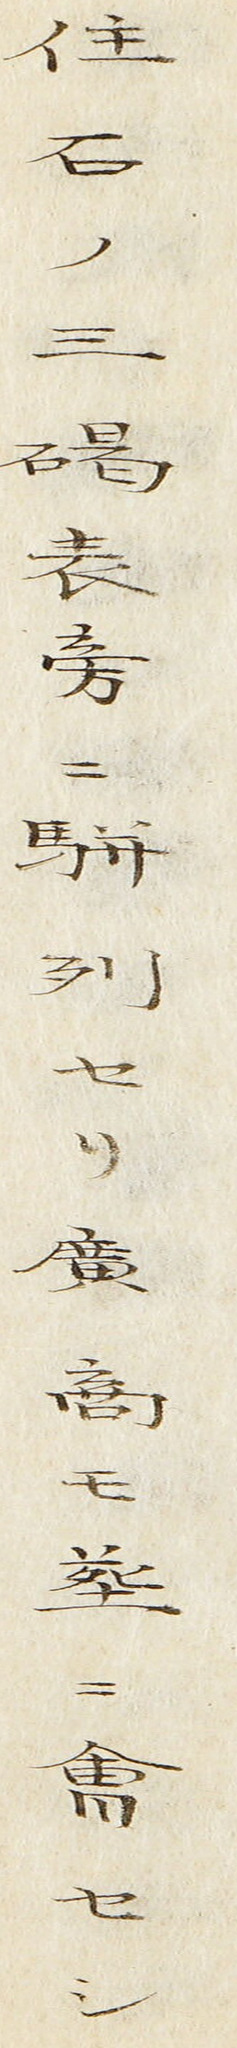住石ノ三碣表旁ニ駢列セリ広商モ葬ニ会セシ
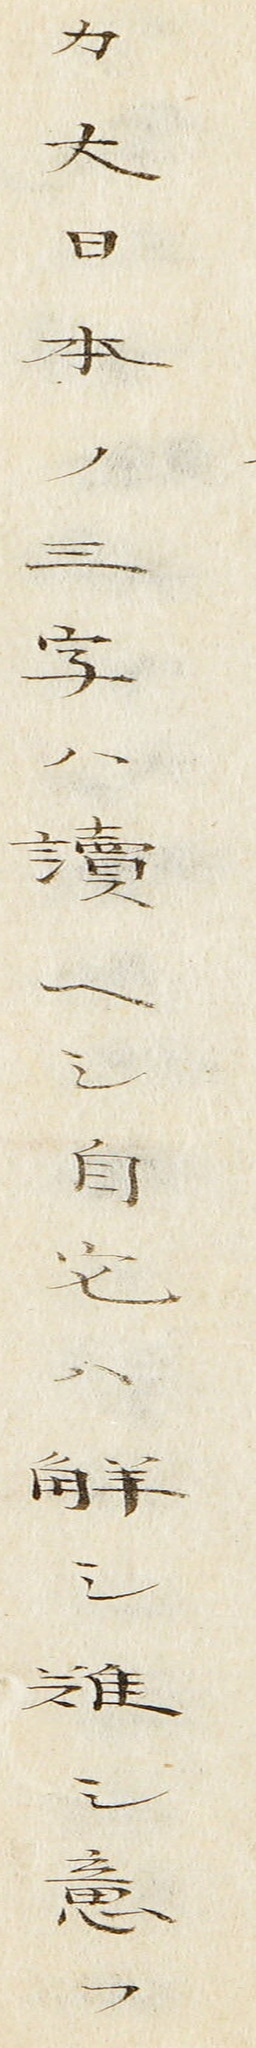カ大日本ノ三字ハ読ヘシ自它ハ解シ難シ意フ
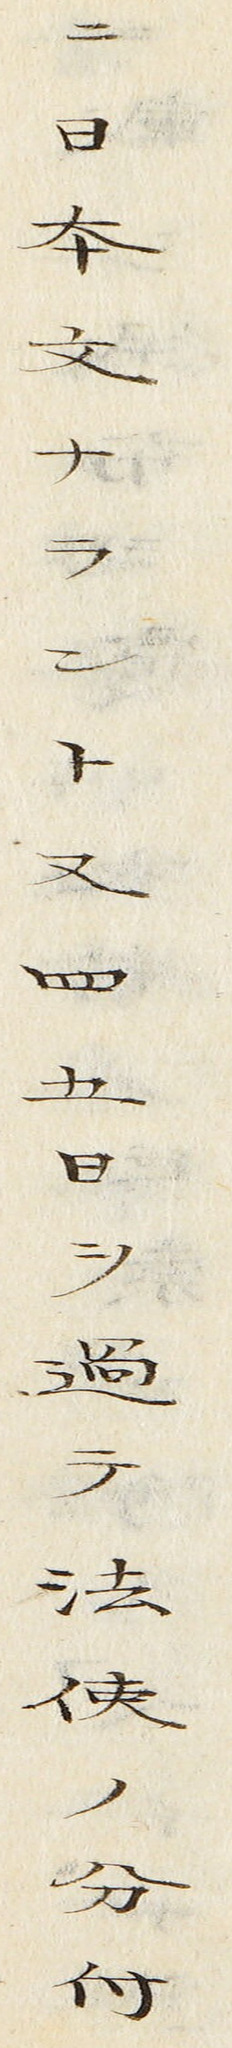ニ日本文ナラント又四五日ヲ過テ法使ノ分付
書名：蕃談
